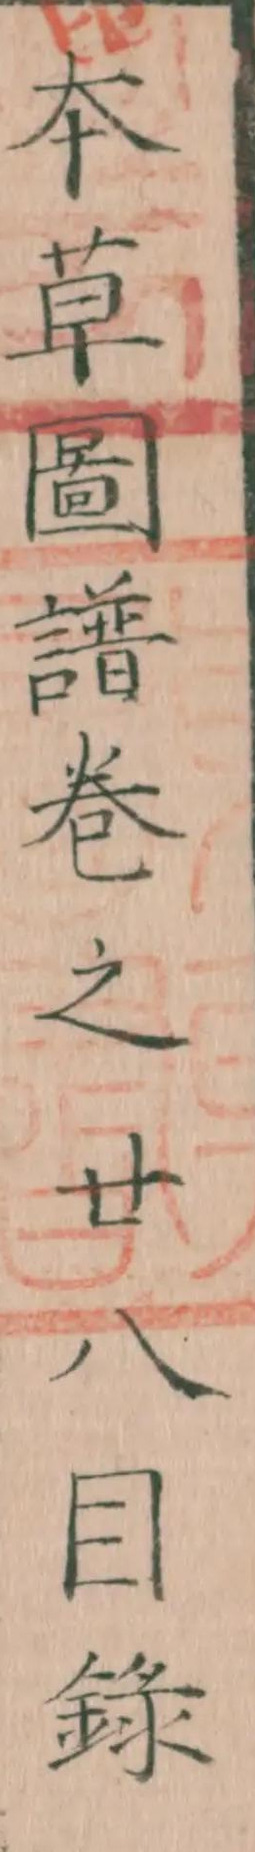本草図譜巻之廿八目録
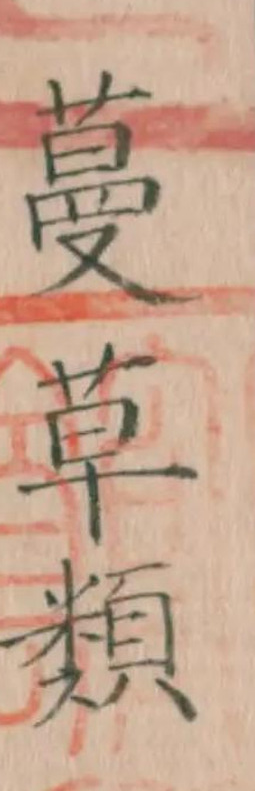蔓草類

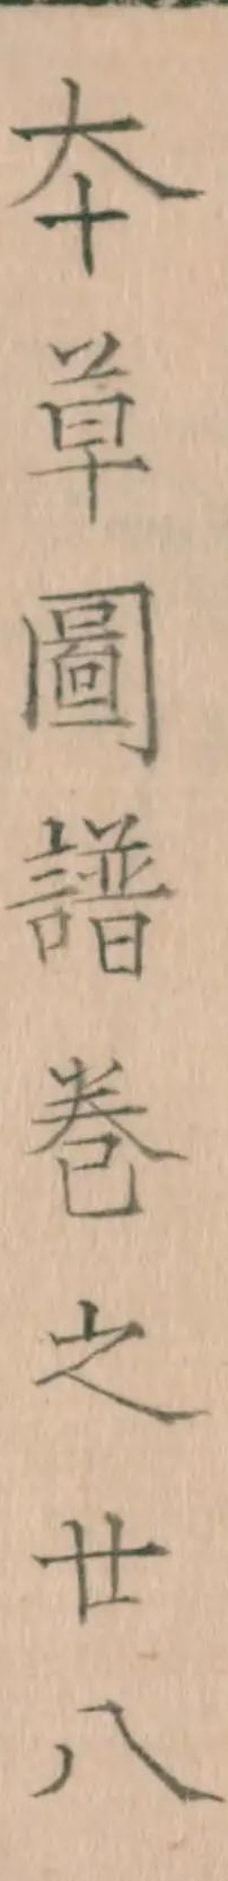本草図譜巻之廿八
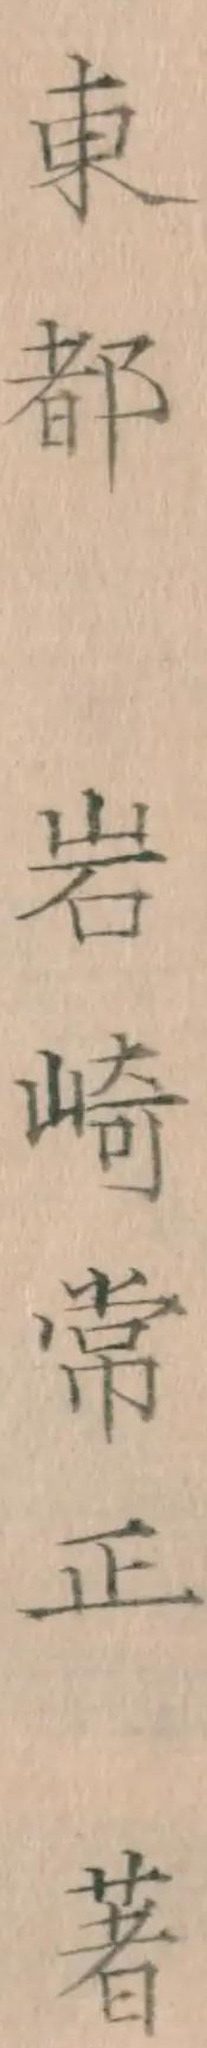東都岩崎常正著
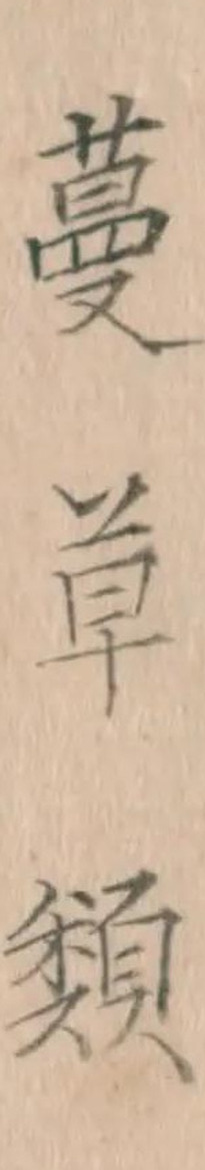蔓草類
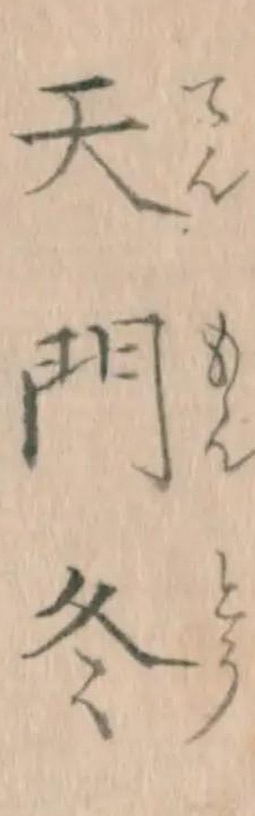天門冬
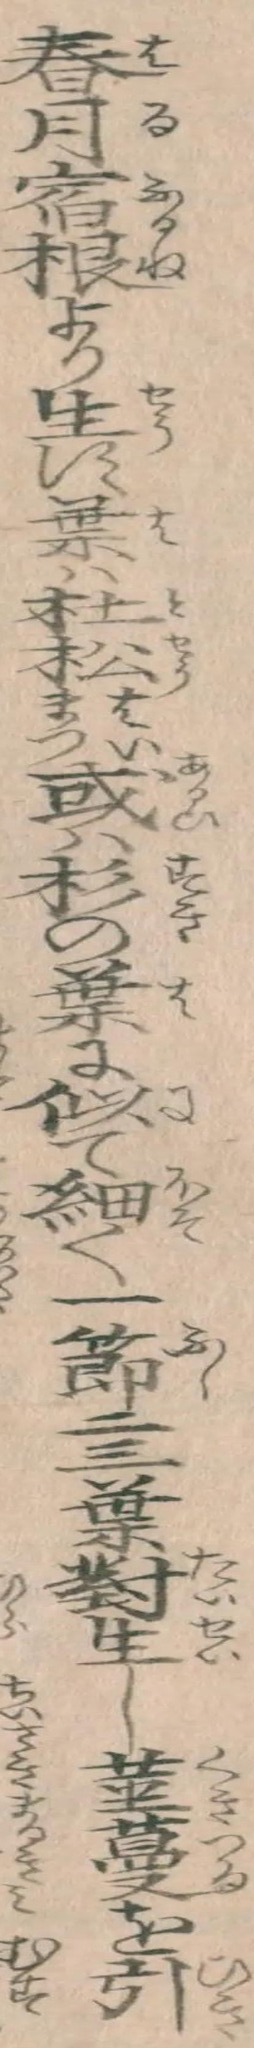春月宿根より生す葉は杜松はいまつ或は杉の葉に似て細く一節二三葉対生し茎蔓を引
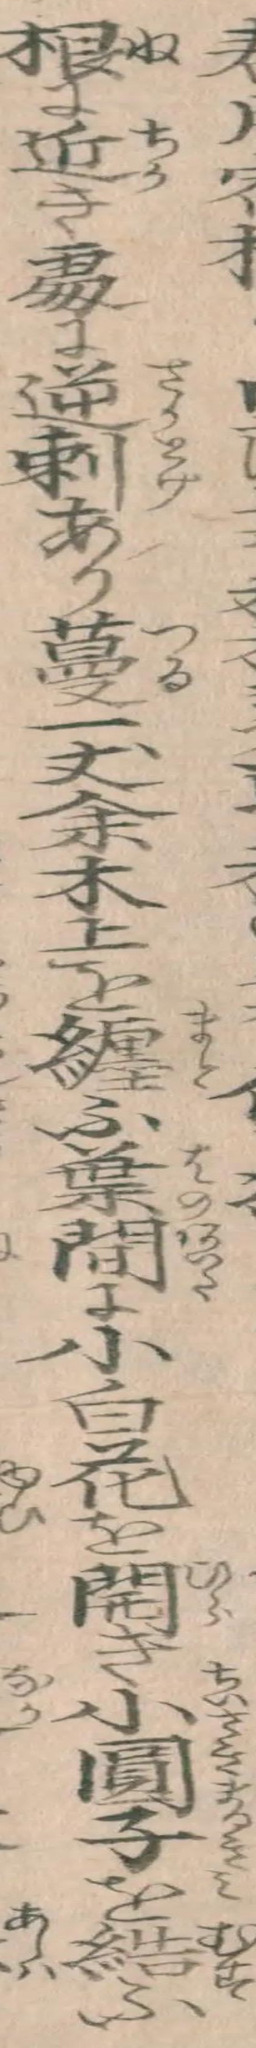根に近き処に逆剌あり蔓一丈余木上を纏ふ葉間に小白花を開き小円子を結ふ
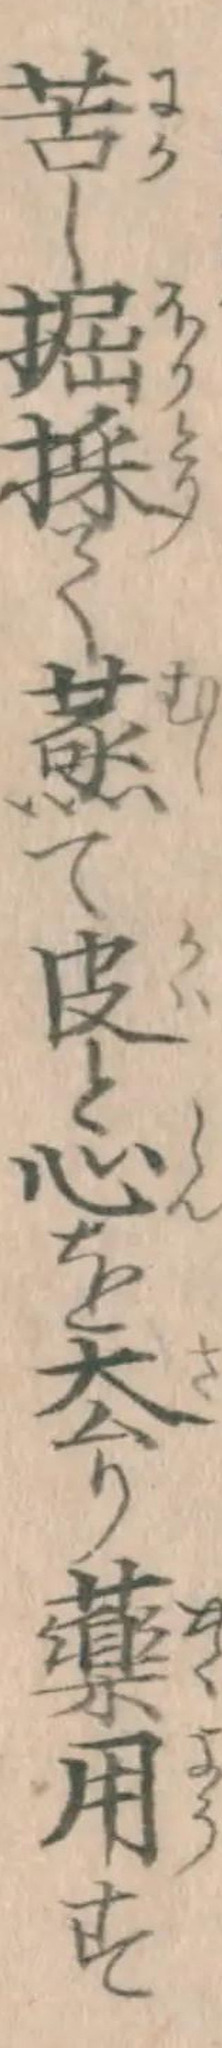苦し掘採て蒸て皮と心を去り薬用す

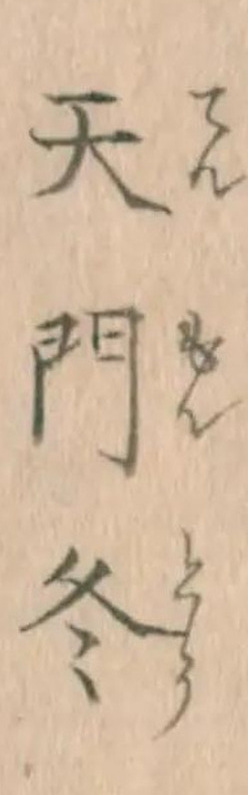天門冬

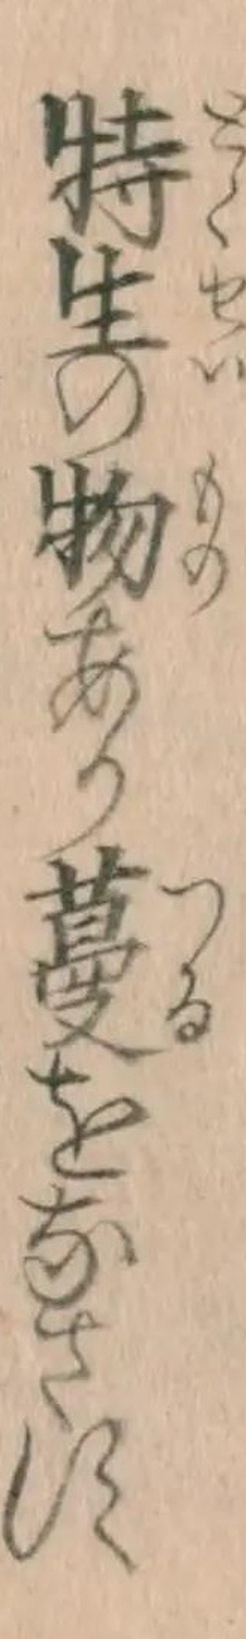特生の物あり蔓をなさす
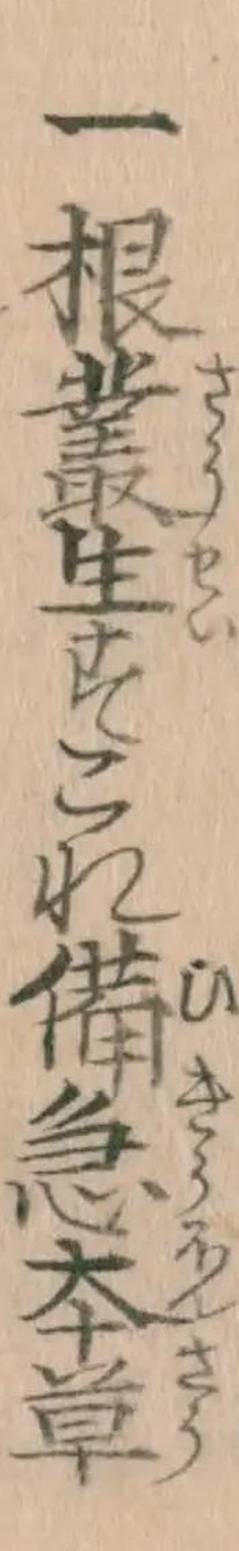一根叢生すこれ備急本草
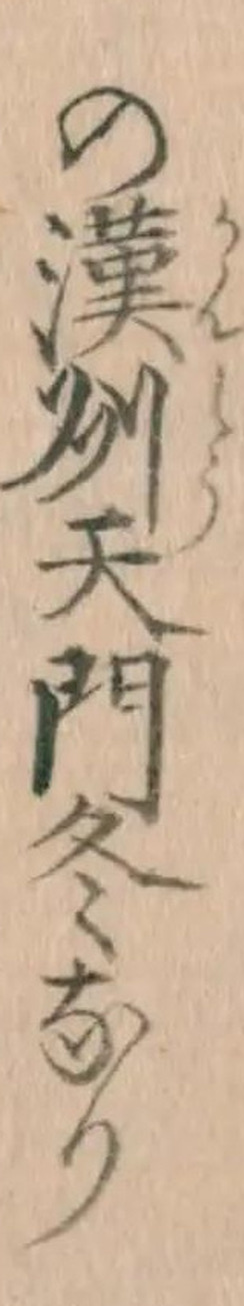の漢州天門冬なり
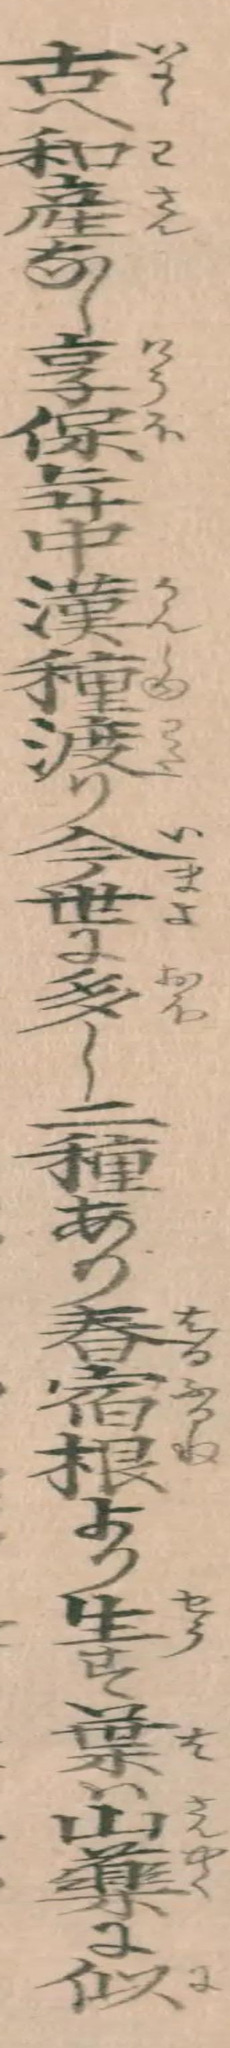古へ和産なし享保年中漢種渡り今世に多し二種あり春宿根より生す葉は山薬に似
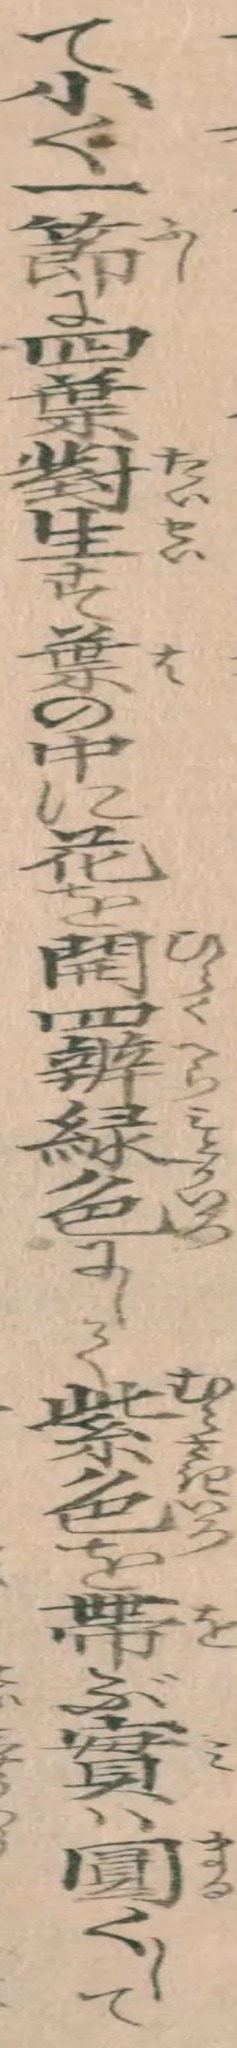て小く一節に四葉対生す葉の中に花を開四弁緑色にして紫色を帯ぶ実は円くして
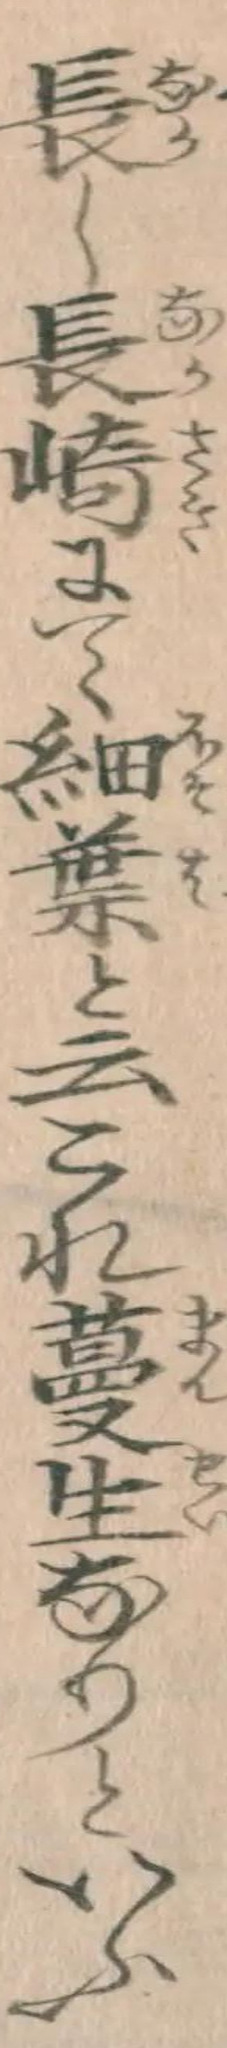長し長崎にて細葉と云これ蔓生なりといふ
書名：本草図譜. 巻28-30
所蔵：国立国会図書館 National Diet Library, JAPAN
